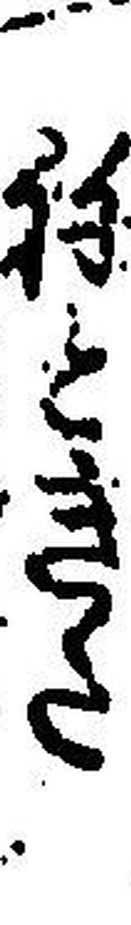ねときた
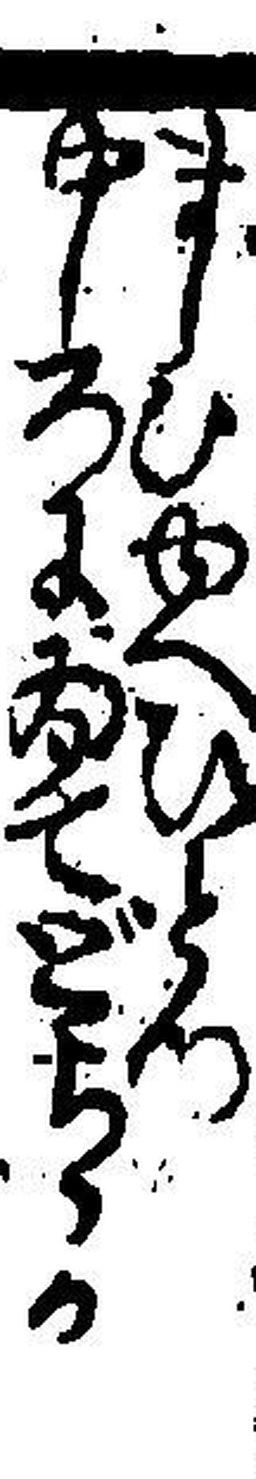やしろにゐてどちらか
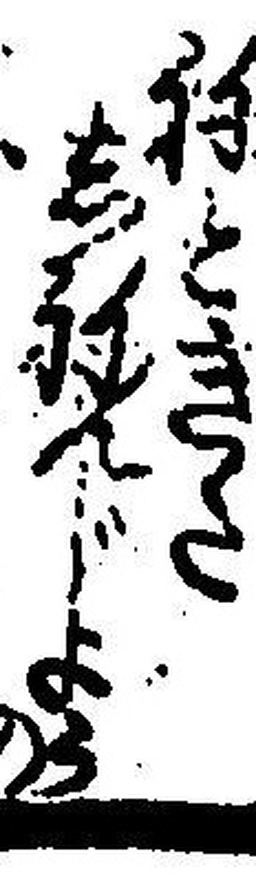しねんじよう
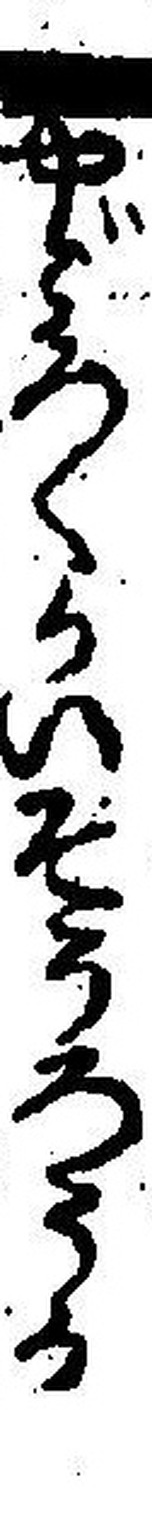やどろくかいそうろうか
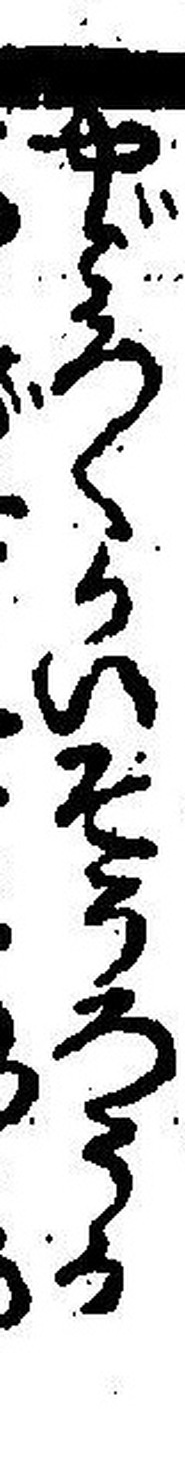やどろくかいそうろうか
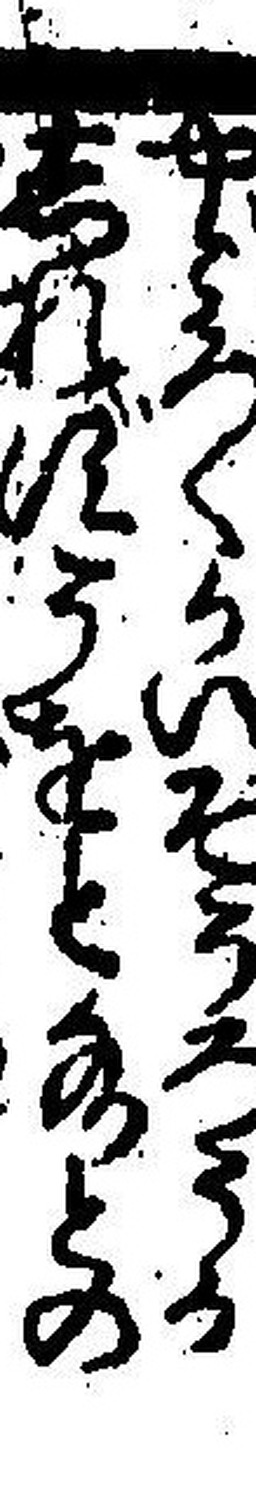しれずうをと水との
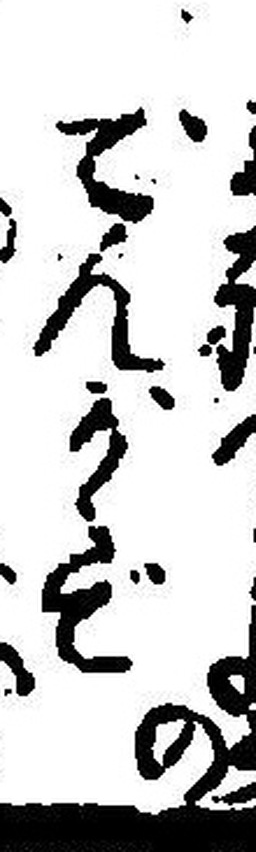でんがくで
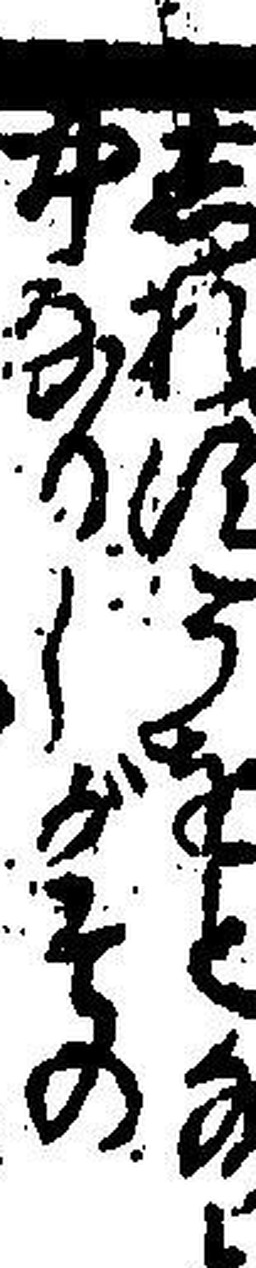中なりしがその
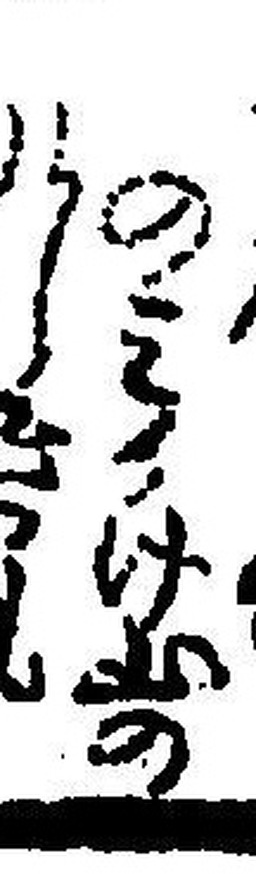けしきも
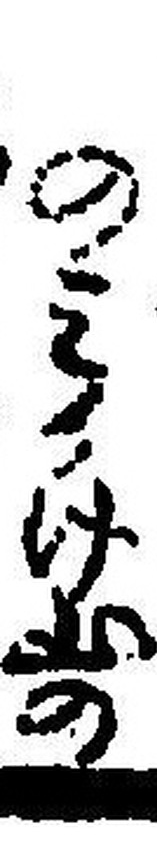のみかけ山の
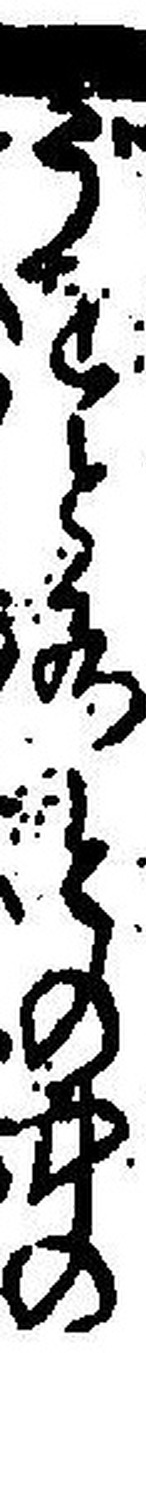うをと水との中の
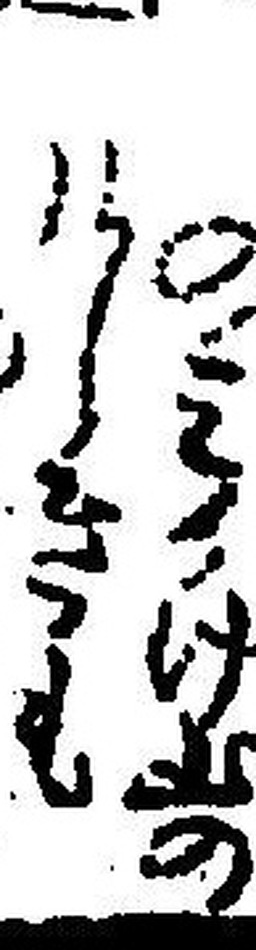けしきも
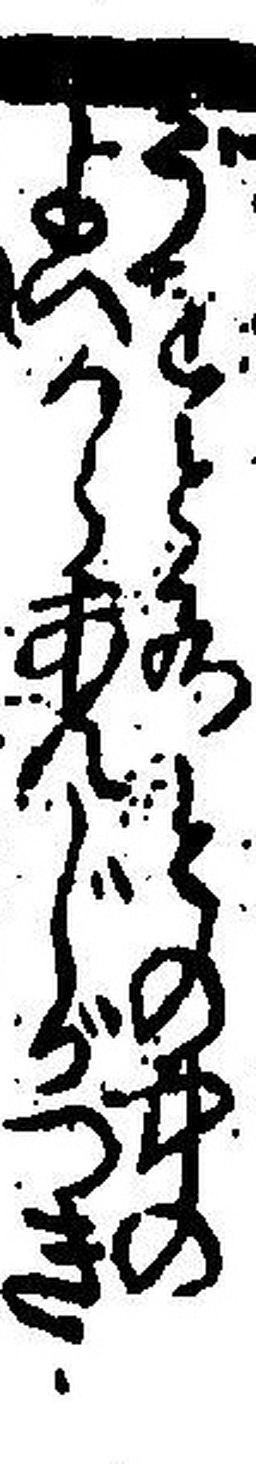よいからあんじがつき
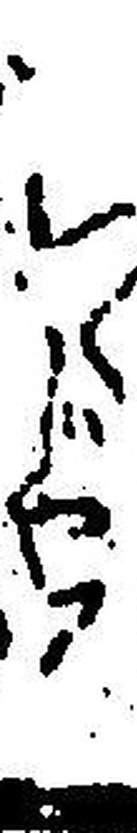いゝじやァ
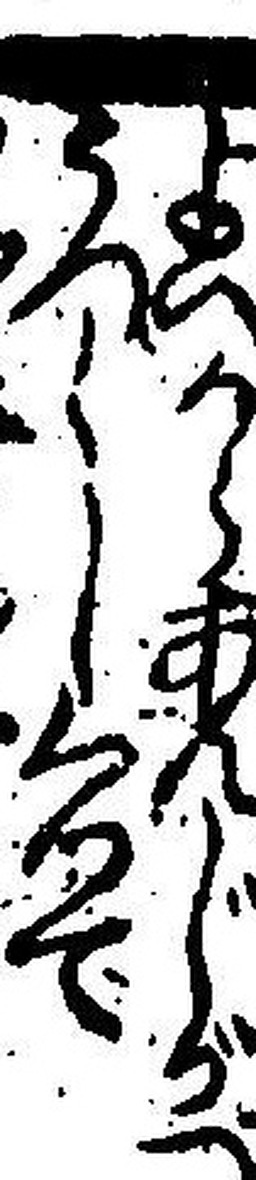うつくしくつて
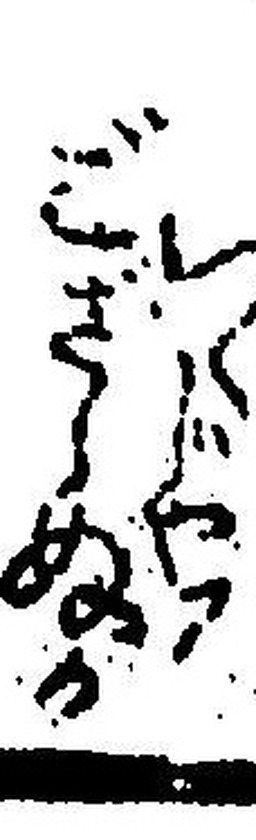ござらぬか
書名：徳若水縁起金性 / 樹下石上作
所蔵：東京大学総合図書館 General Library in the University of Tokyo, JAPAN
